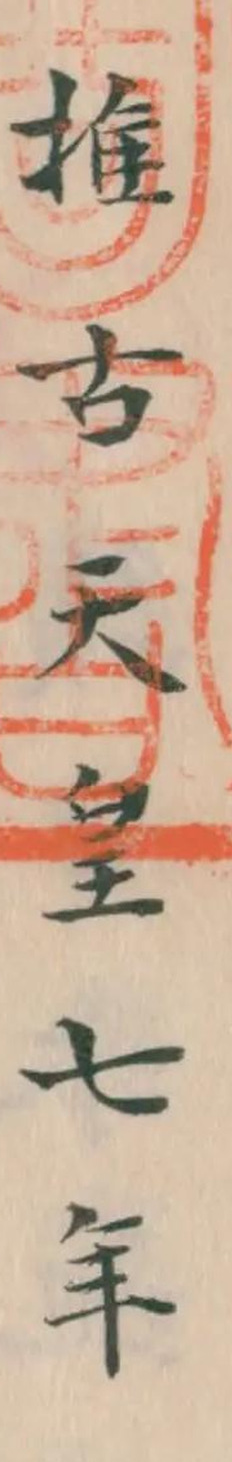推古天皇七年
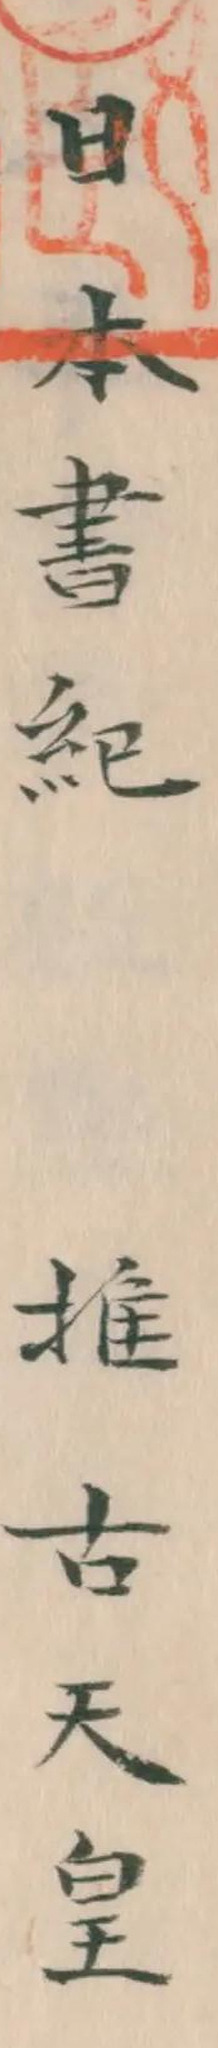日本書紀推古天皇
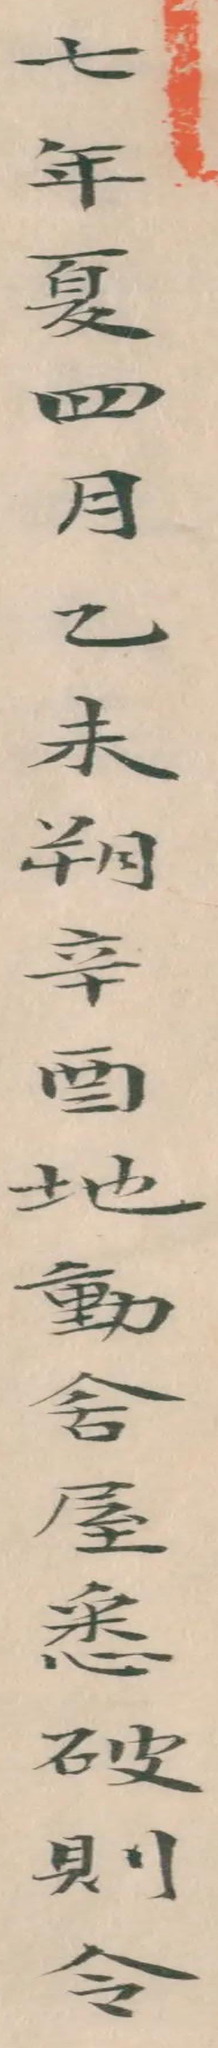七年夏四月乙未朔辛酉地動舎屋悉破則令
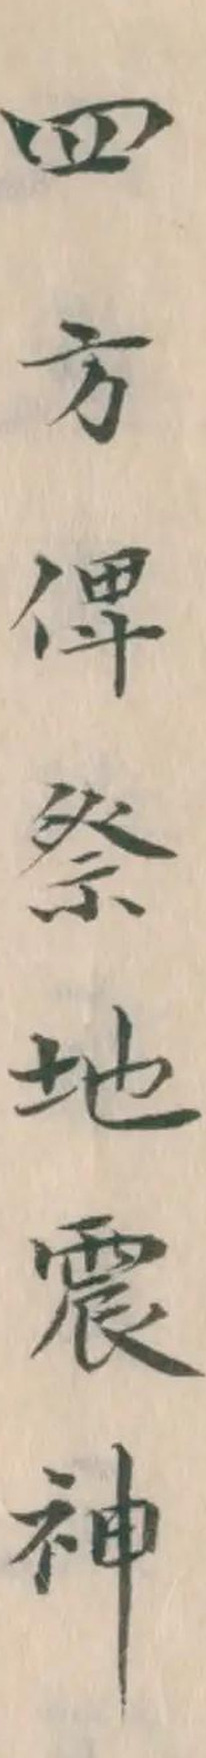四方俾祭地震神
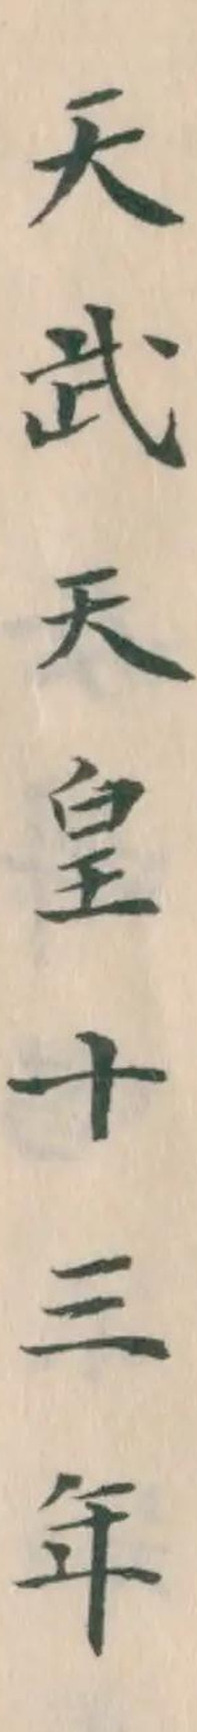天武天皇十三年
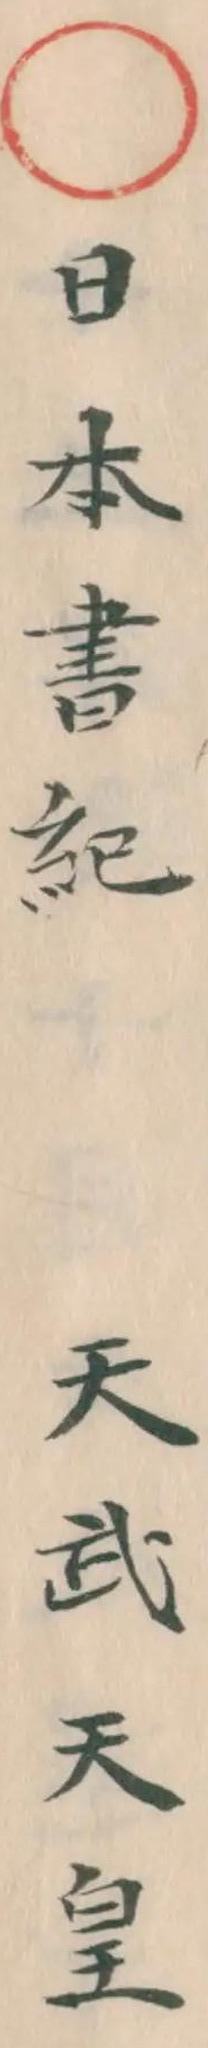○日本書紀天武天皇

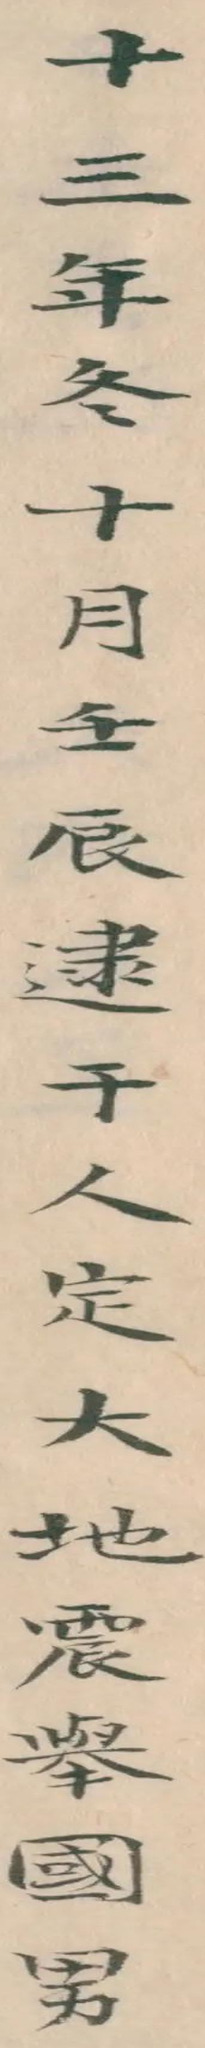十三年冬十月壬辰逮千人定大地震挙国男
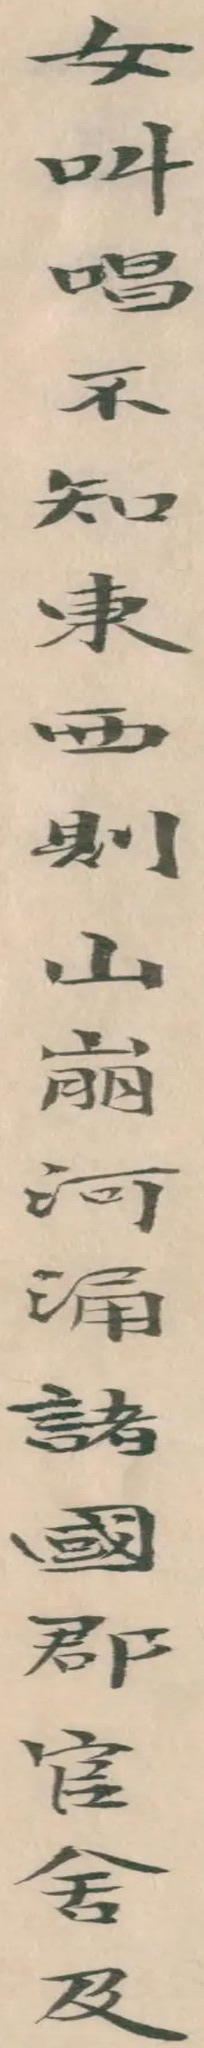女叫唱不知東西則山崩河涌諸国郡官舎及
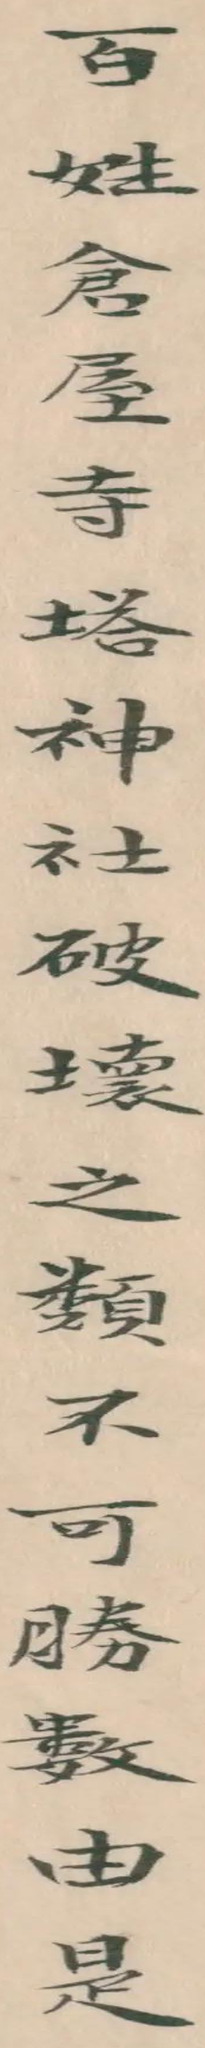百姓倉屋寺塔神社破壊之類不可勝数由是
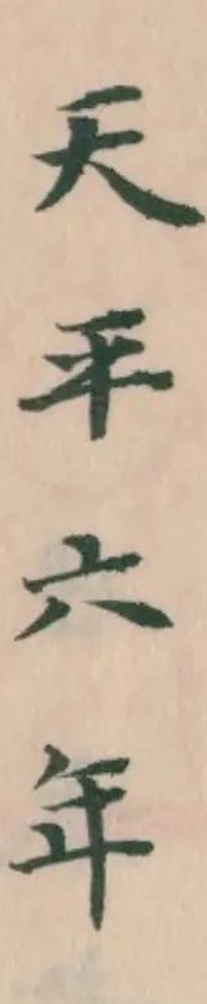天平六年
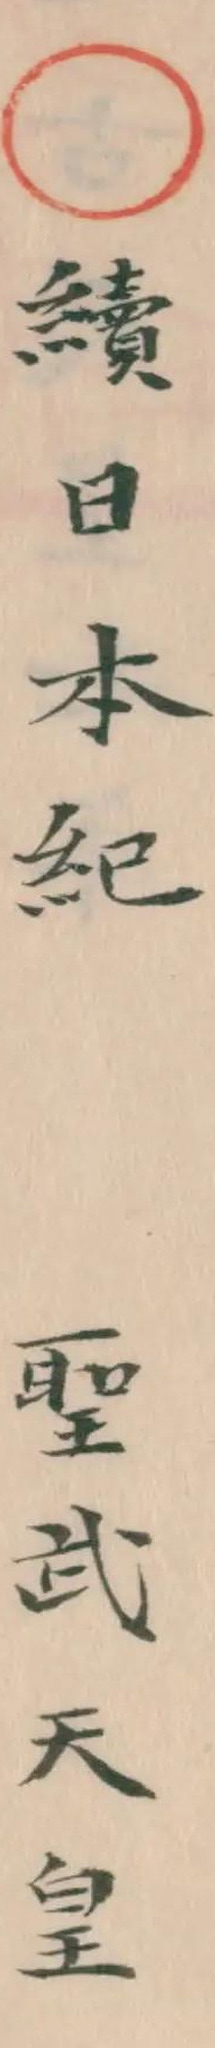○続日本紀聖武天皇
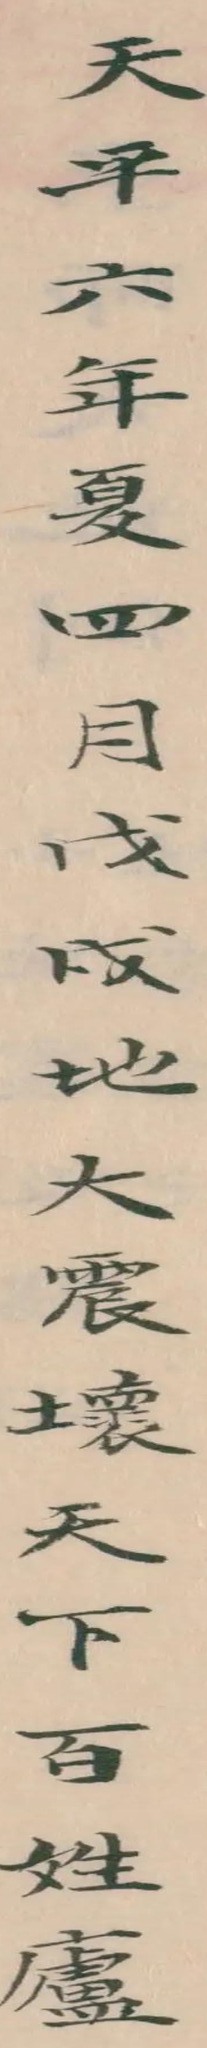天平六年夏四月戊戌地大震壊天下百姓廬
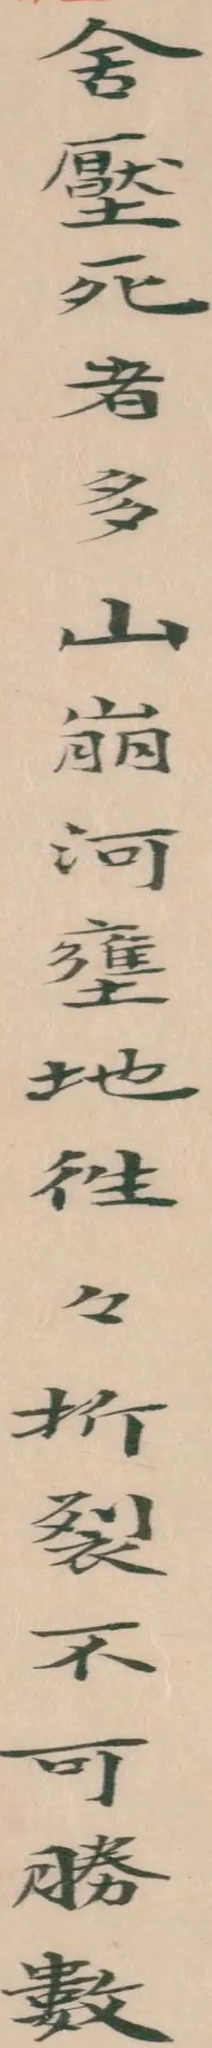舎圧死者多山崩河壅地往々折裂不可勝数
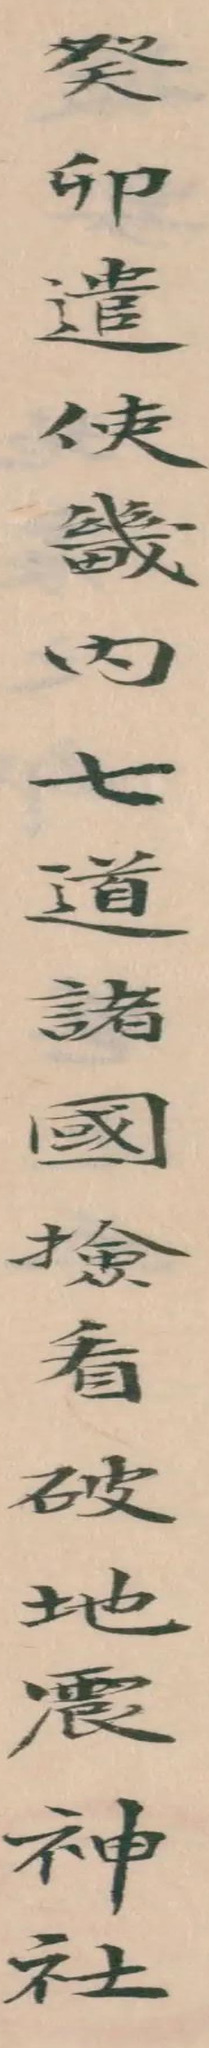癸卯遣使畿内七道諸国検看破地震神社
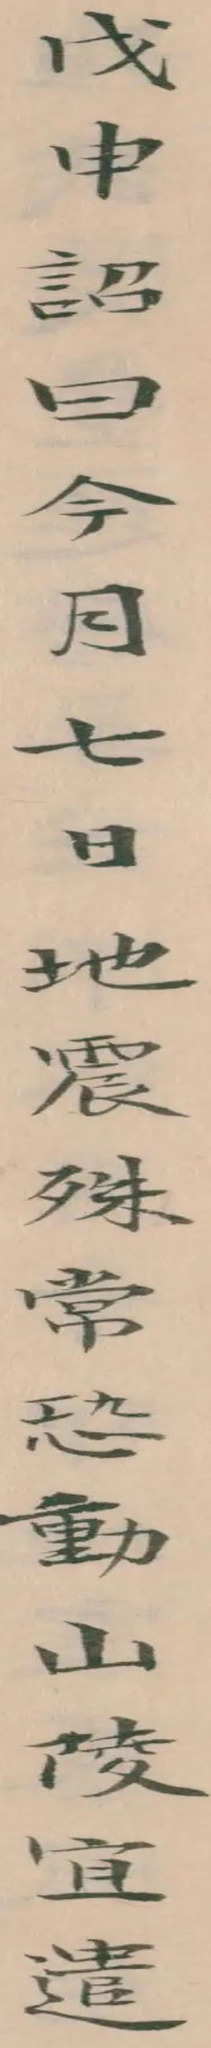戊申詔曰今月七日地震殊常恐動山陵宜遣
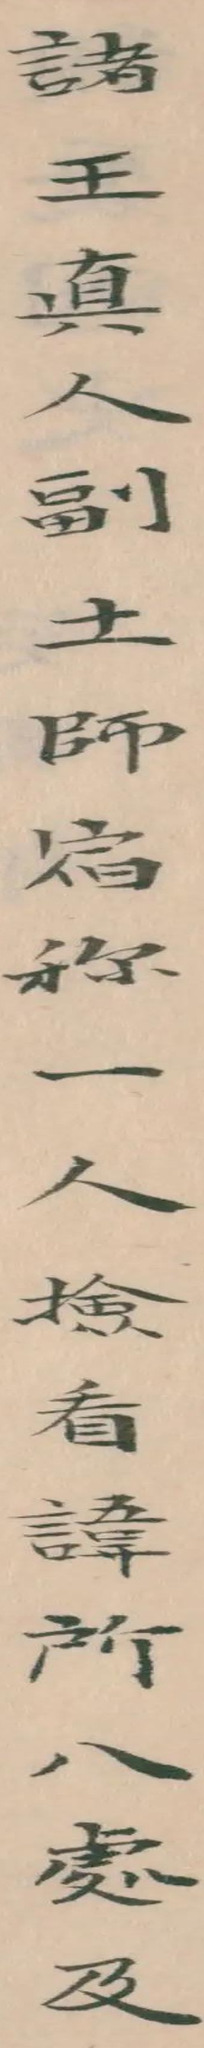諸王真人副土師宿祢一人検看諱所八処及
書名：地災撮要. 巻5-6(地震之部)
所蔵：国立国会図書館 National Diet Library, JAPAN
